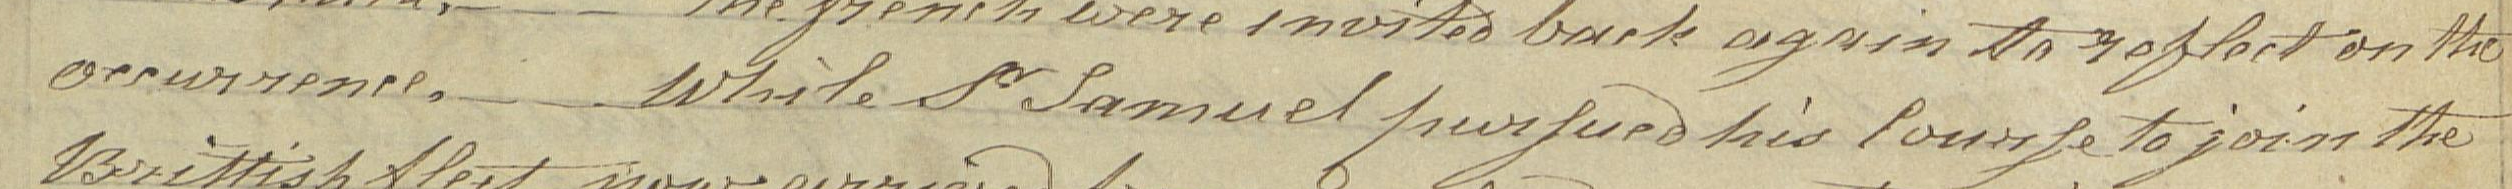occurrence. While S^r Samuel pursued his Course to join the
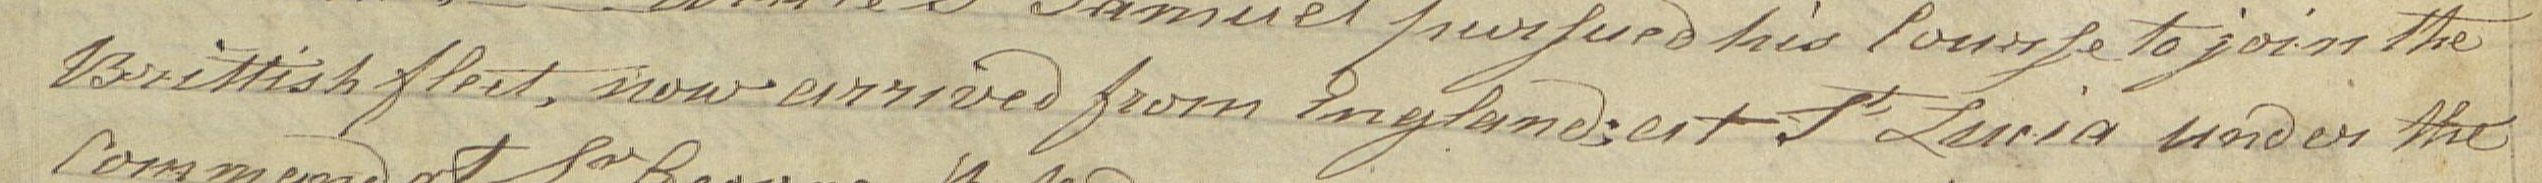Brittish fleet, now arrived from England; at S^t Lucia under the
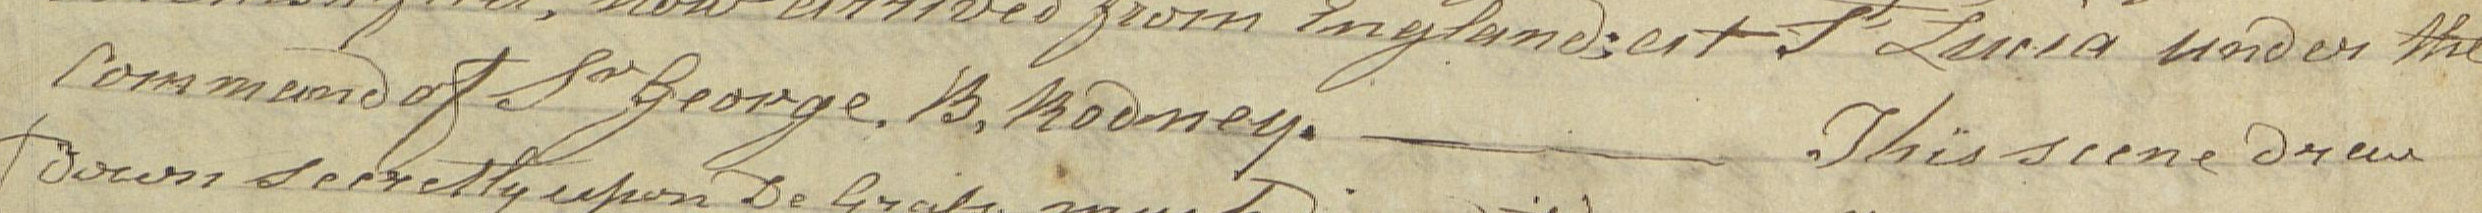Command of S^r George B. Rodney, This scene drew
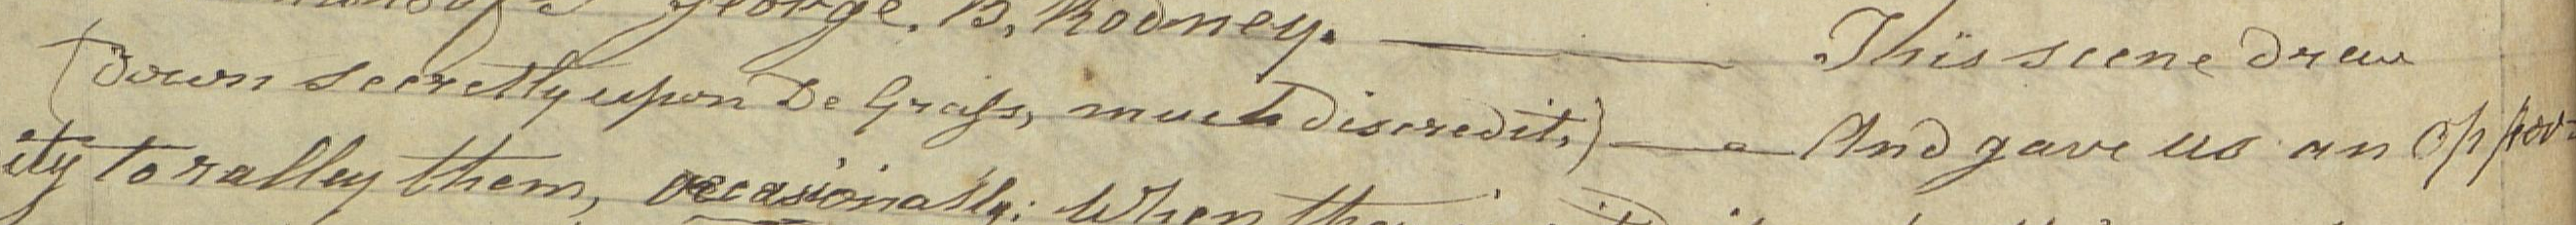(Down secretly upon De Grass, much discredit,) And gave us an Oppor-
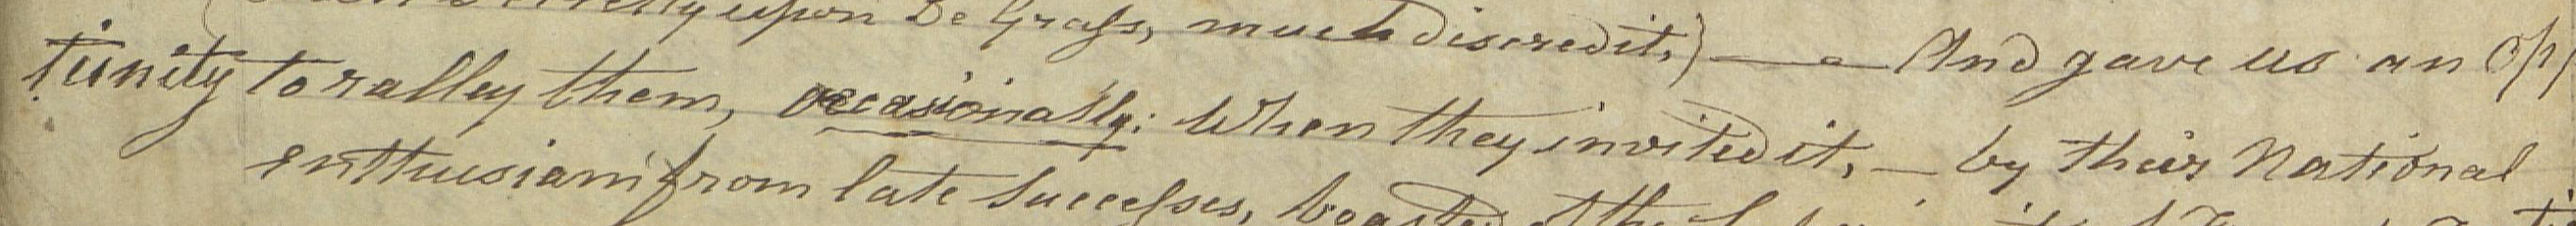-tunity to rally them, occasionally when they invited it, by their national
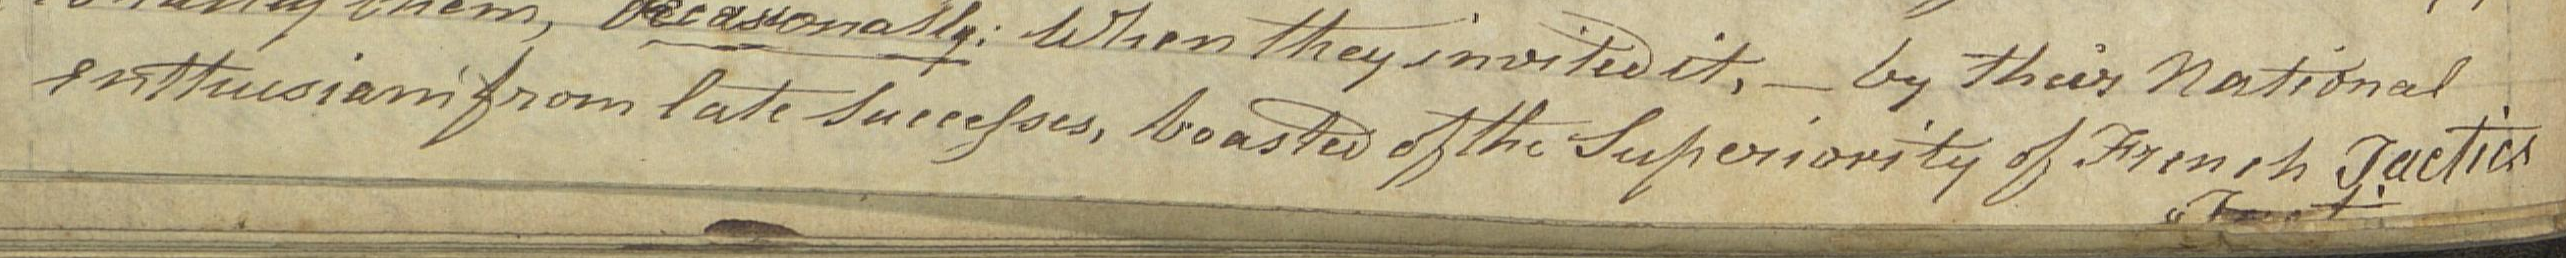enthusiam from late Successes, boasted of the Superiority of French Tactics
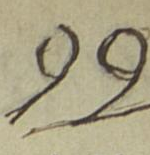99
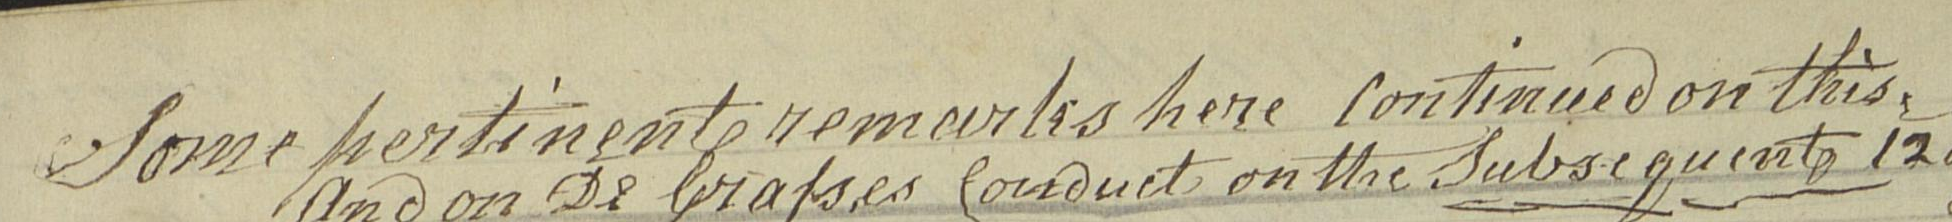Some pertinent remarks here continued on this,
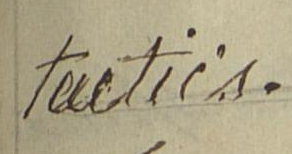tactics.
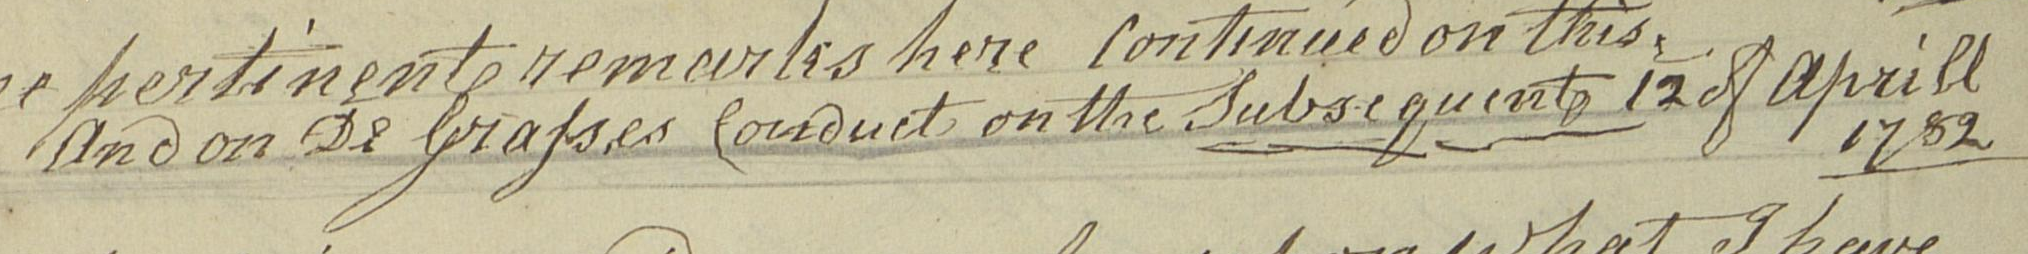And on De Grasses Conduct on the Subsequent 12 of April
